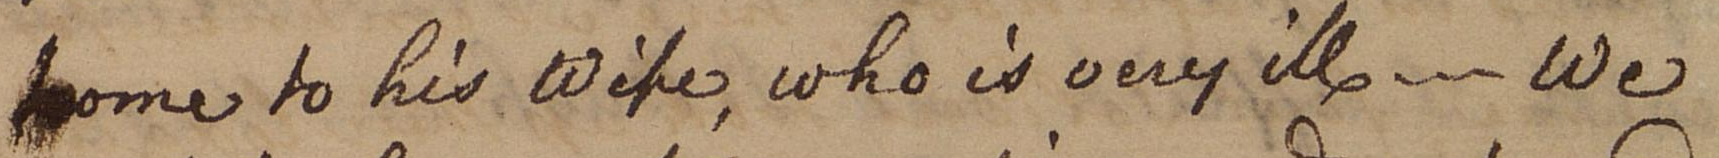home to his Wife, who is very ill- We
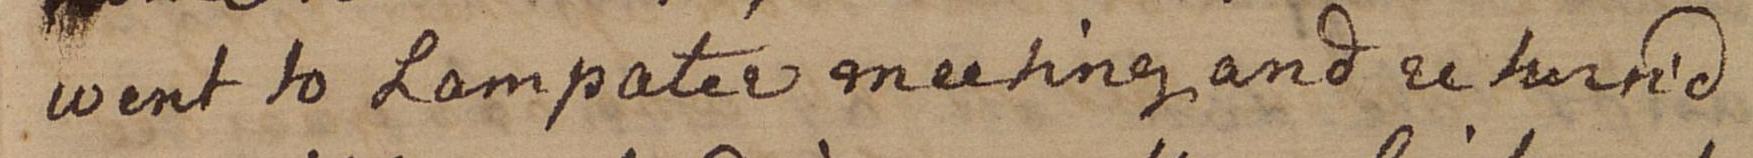went to Lampater meeting and return'd
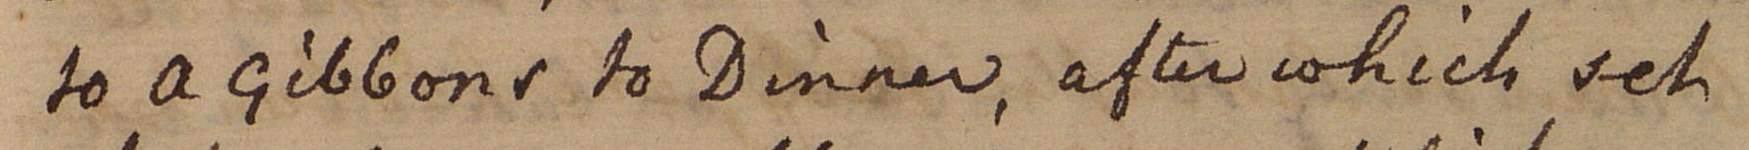to A Gibbons to Dinner, after which set
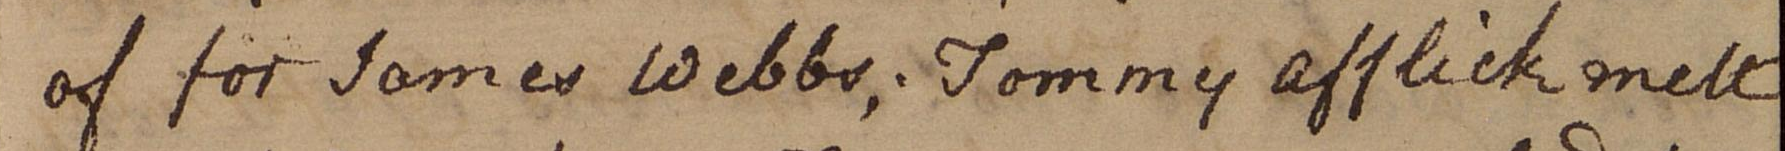of for James Webbs; Tommy Afflick mett
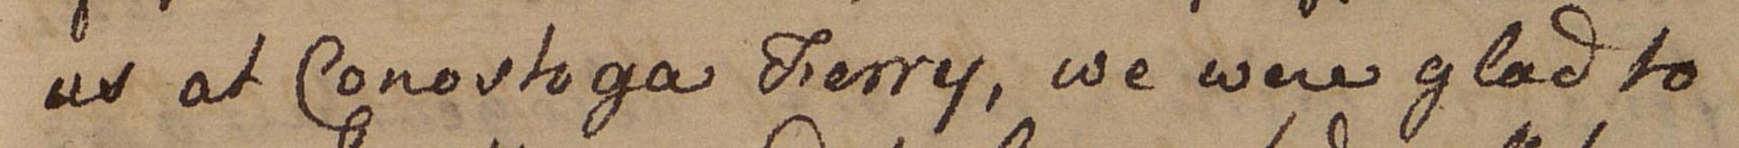us at Conostoga Ferry, we were glad to
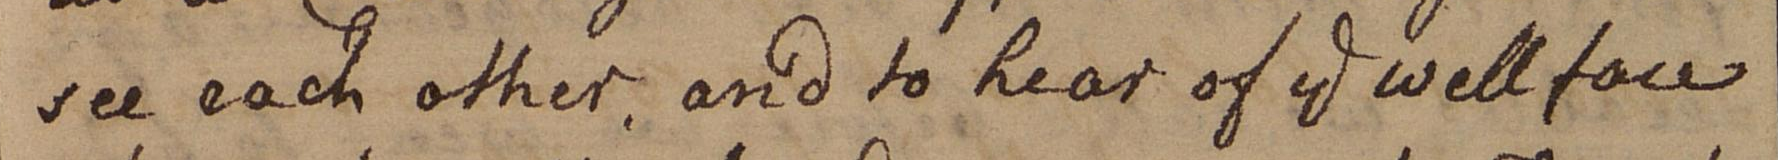see each other, and to hear of y^e well fare
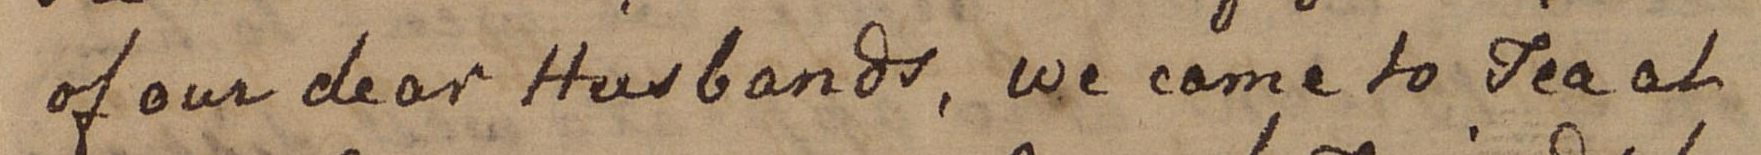of our dear Husbands, we came to Tea at
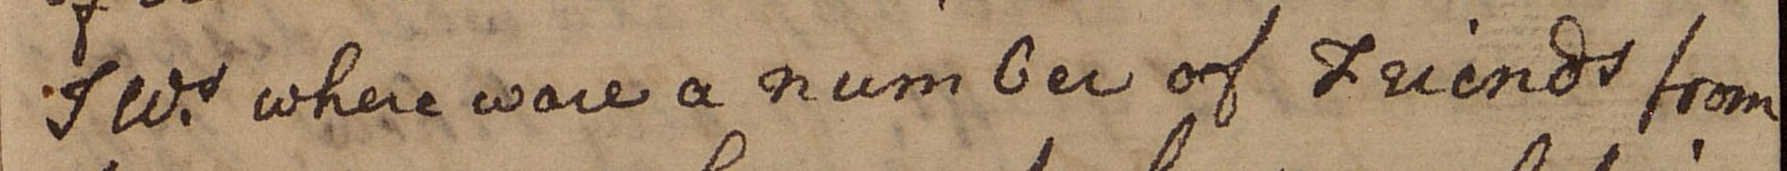S W^s. where ware a number of Friends from
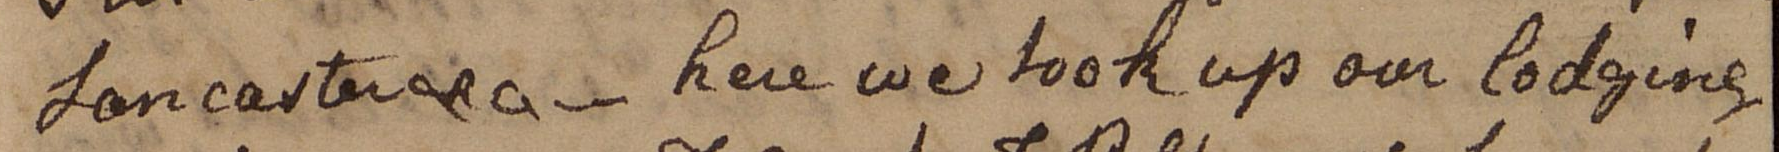Lancaster &c-- here we took up our lodging
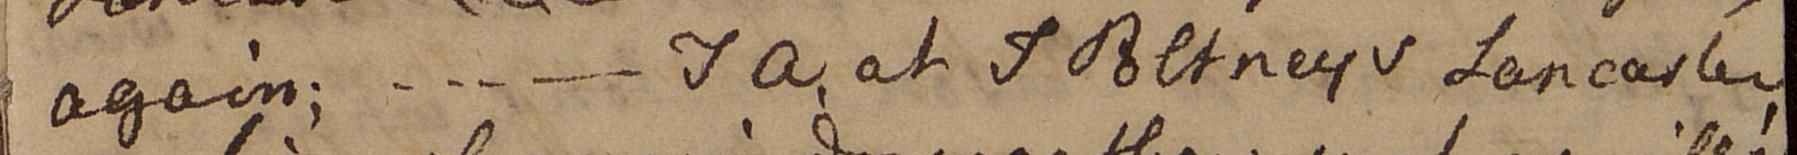again;-- TA at S Poltneys Lancaster
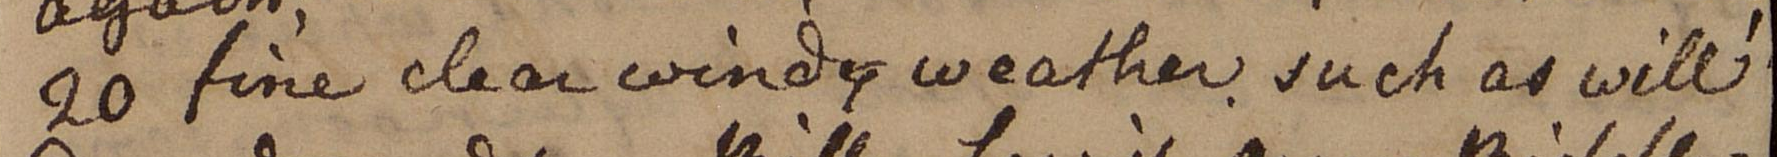20 fine clear windy weather such as will
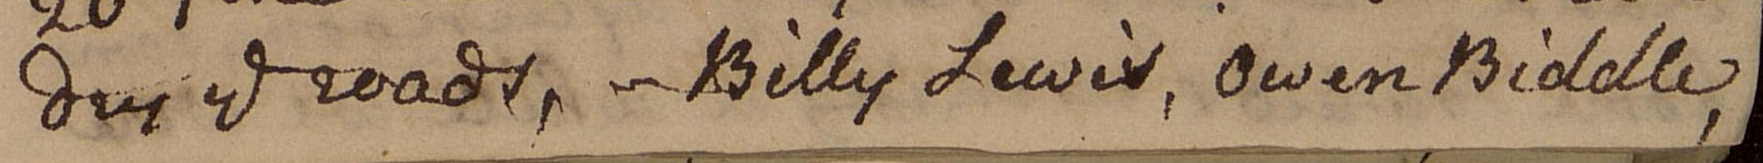dry y^e reads,- Billy Lewis, Owen Biddle,
